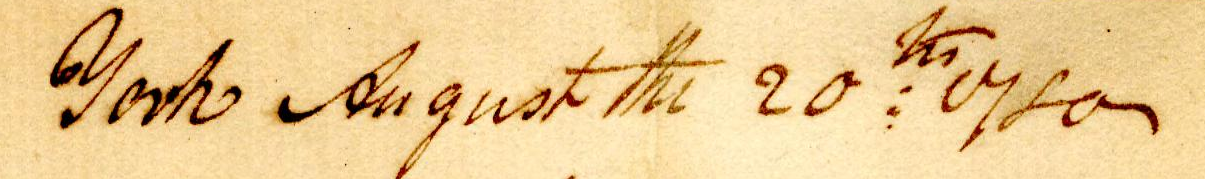York August the 20^th: 1780
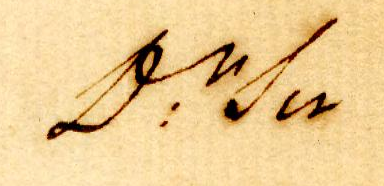D^r: Sir
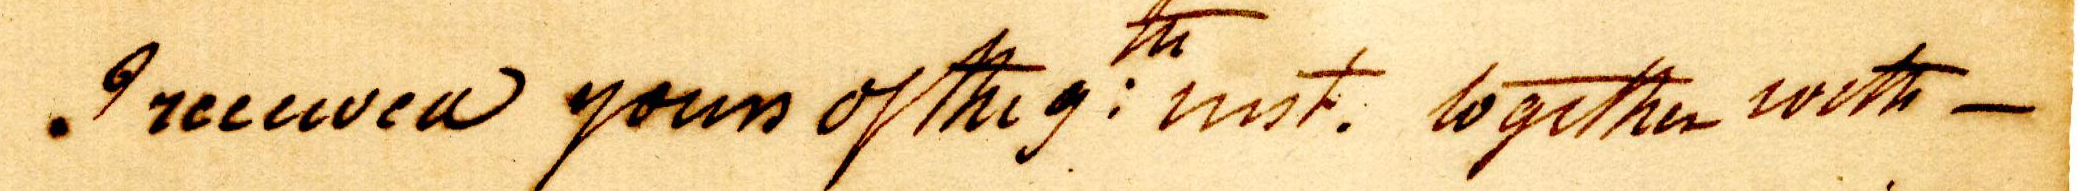I received yours of the 9^th last. together with
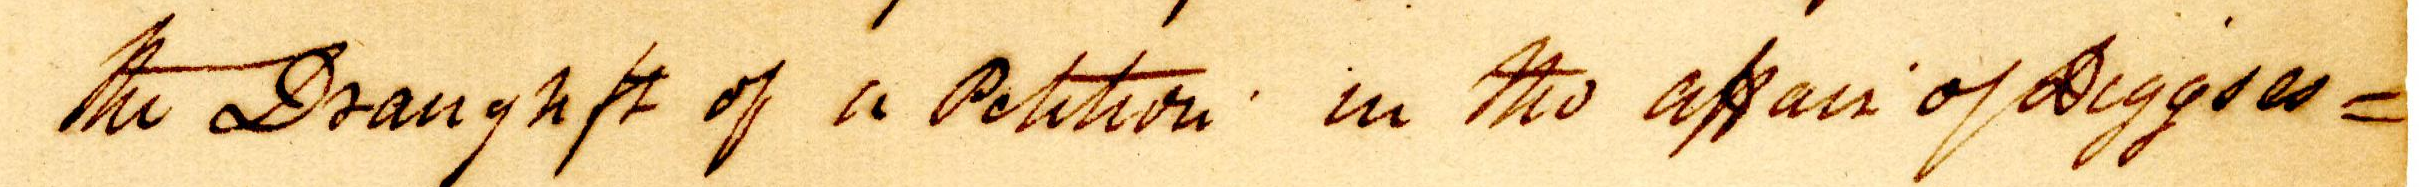the Draught of a Petition in the affair of Deggses
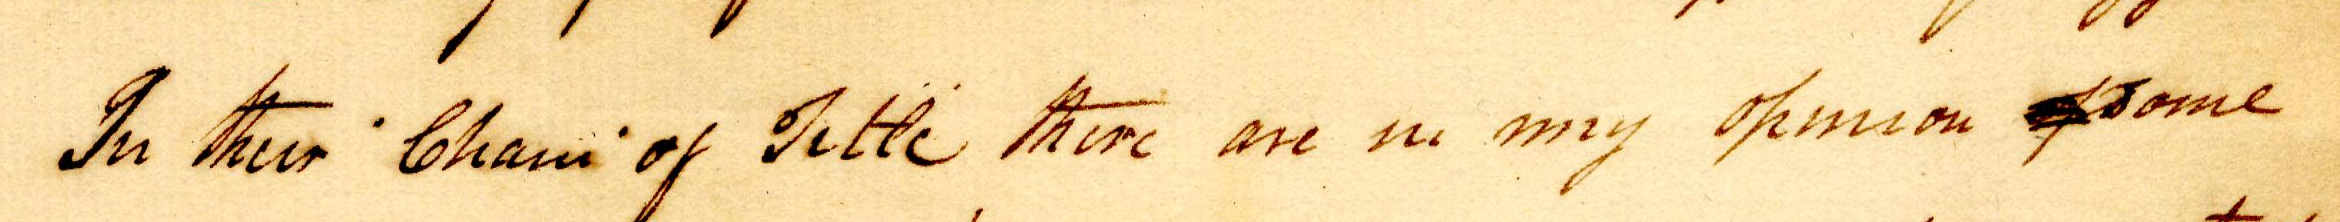In their Chain of Title there are in my opinion of some
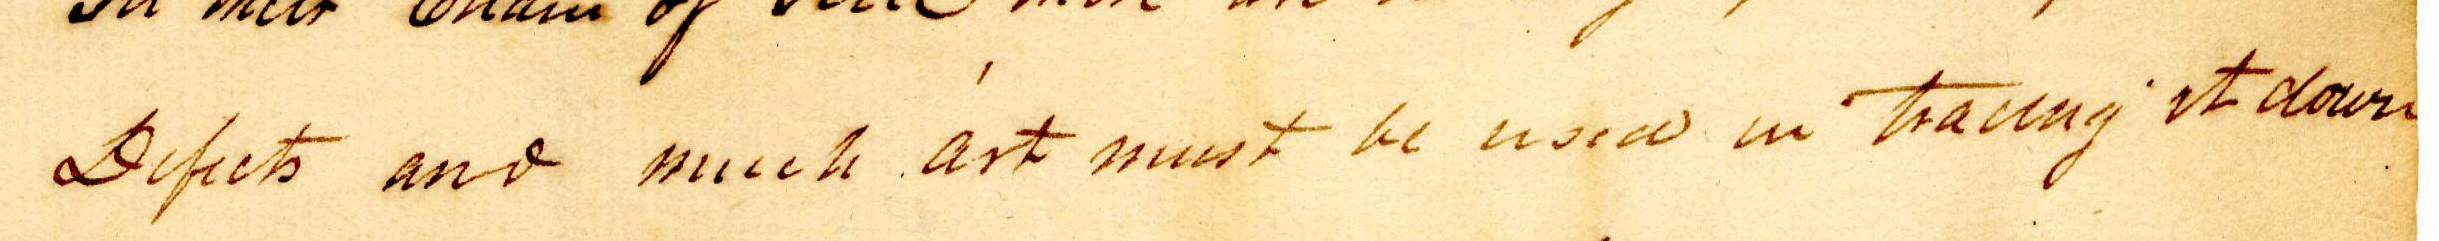Defects and much art must be used in tracing it down
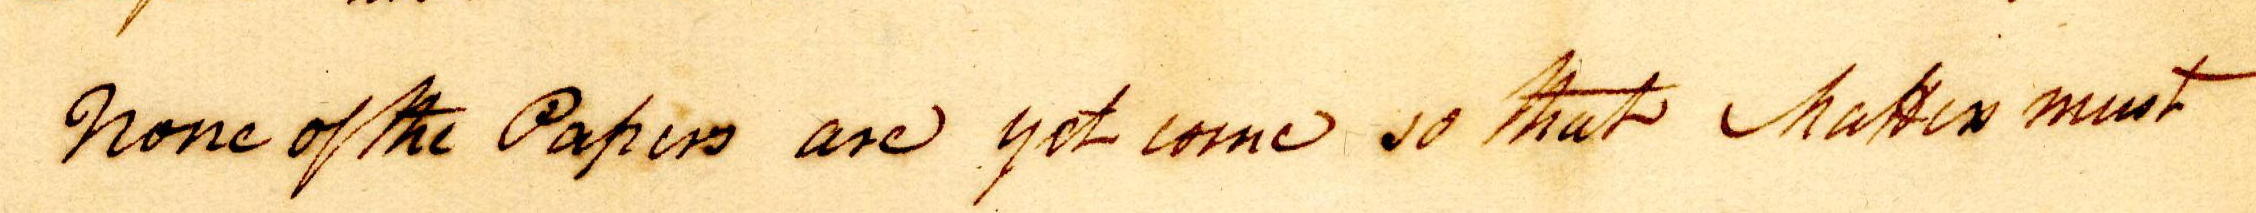none of the Papers are yet come so that Matters must
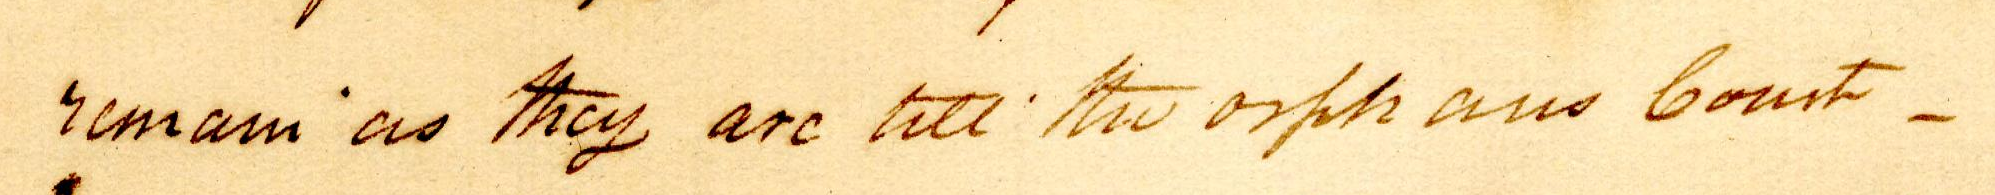remain as they are till the ophans Court.
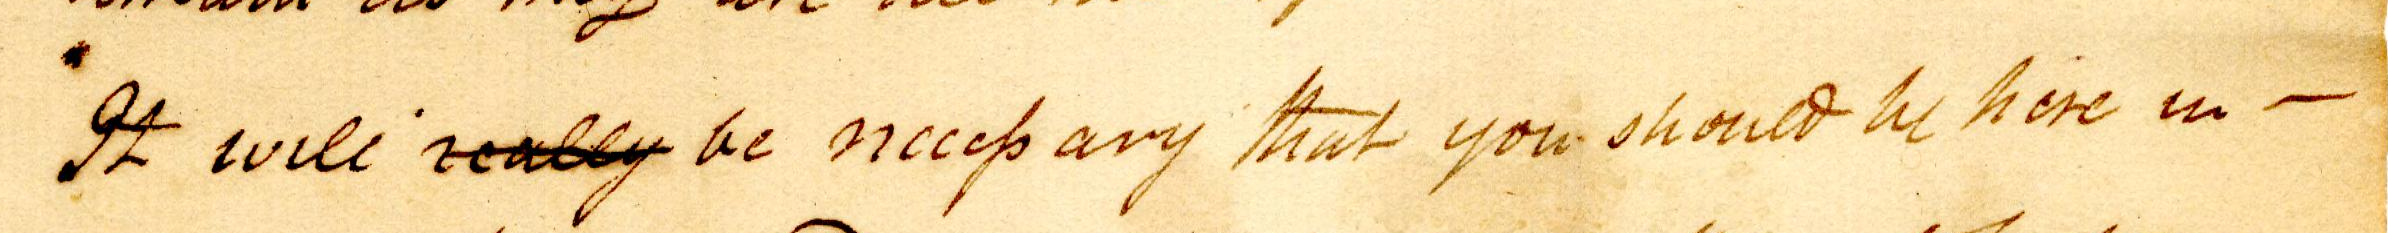It will really be necessary that you should be here in
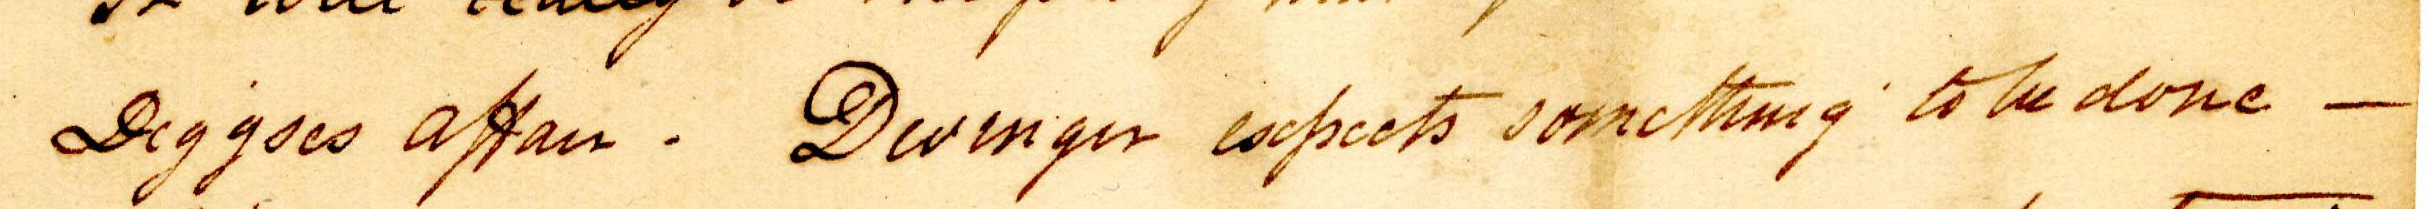Deggses affair. Devenger expects something to be done
